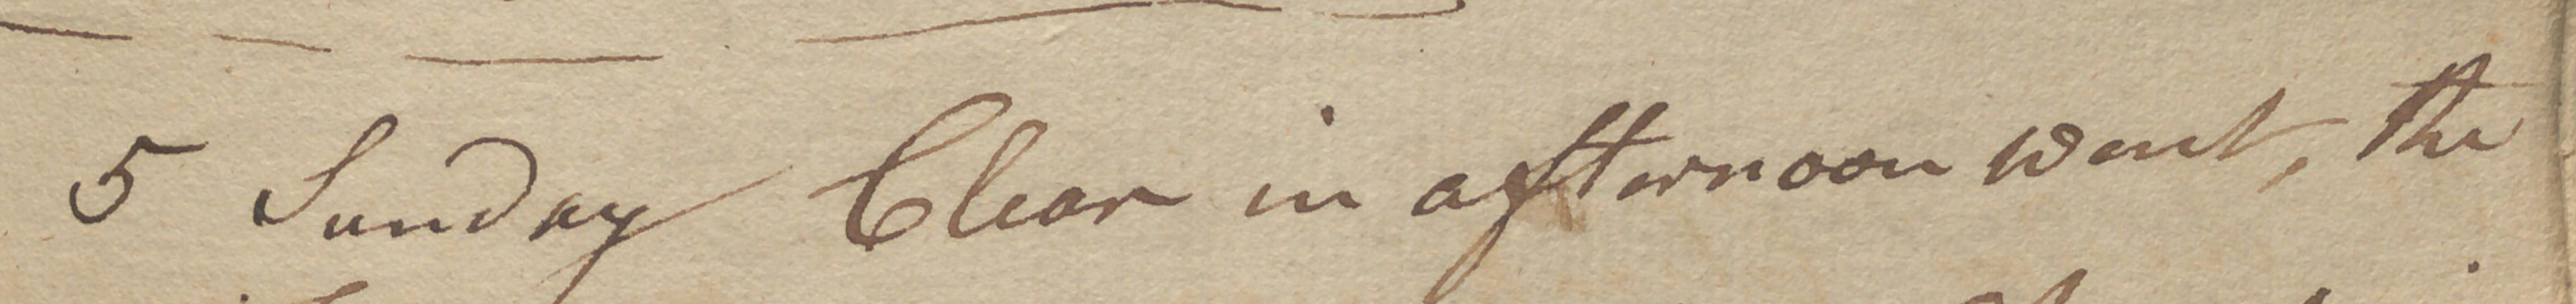5 Sunday Clear in afternoon went, the
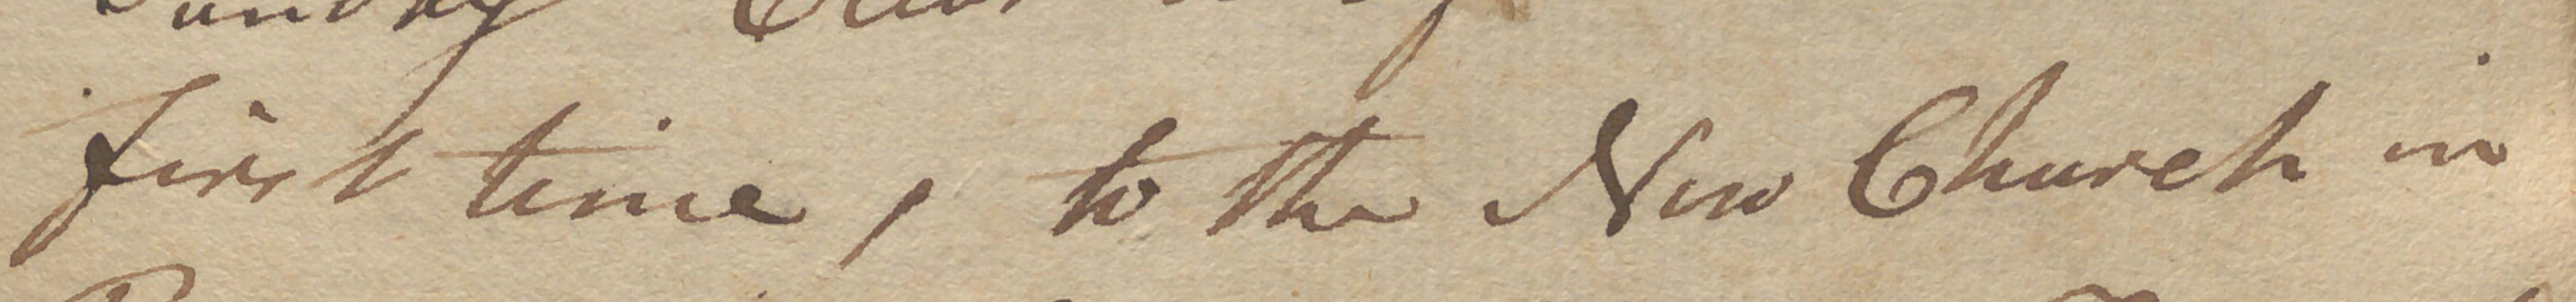first time, to the New Church in
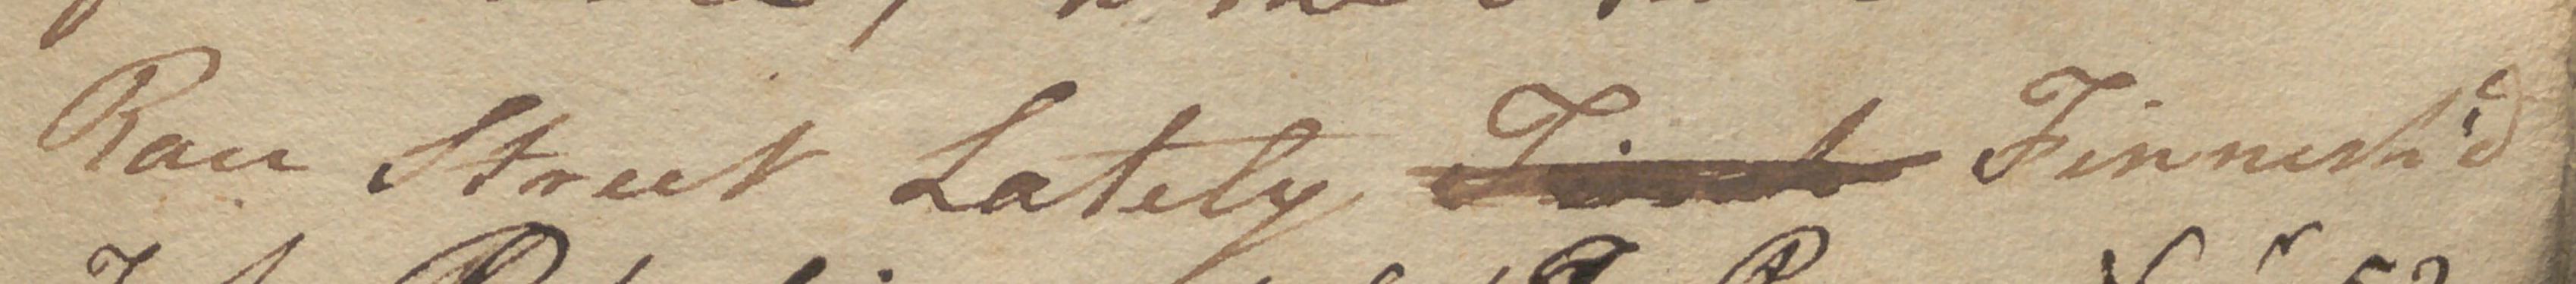Rai Street Lately [_____] Finnish'd
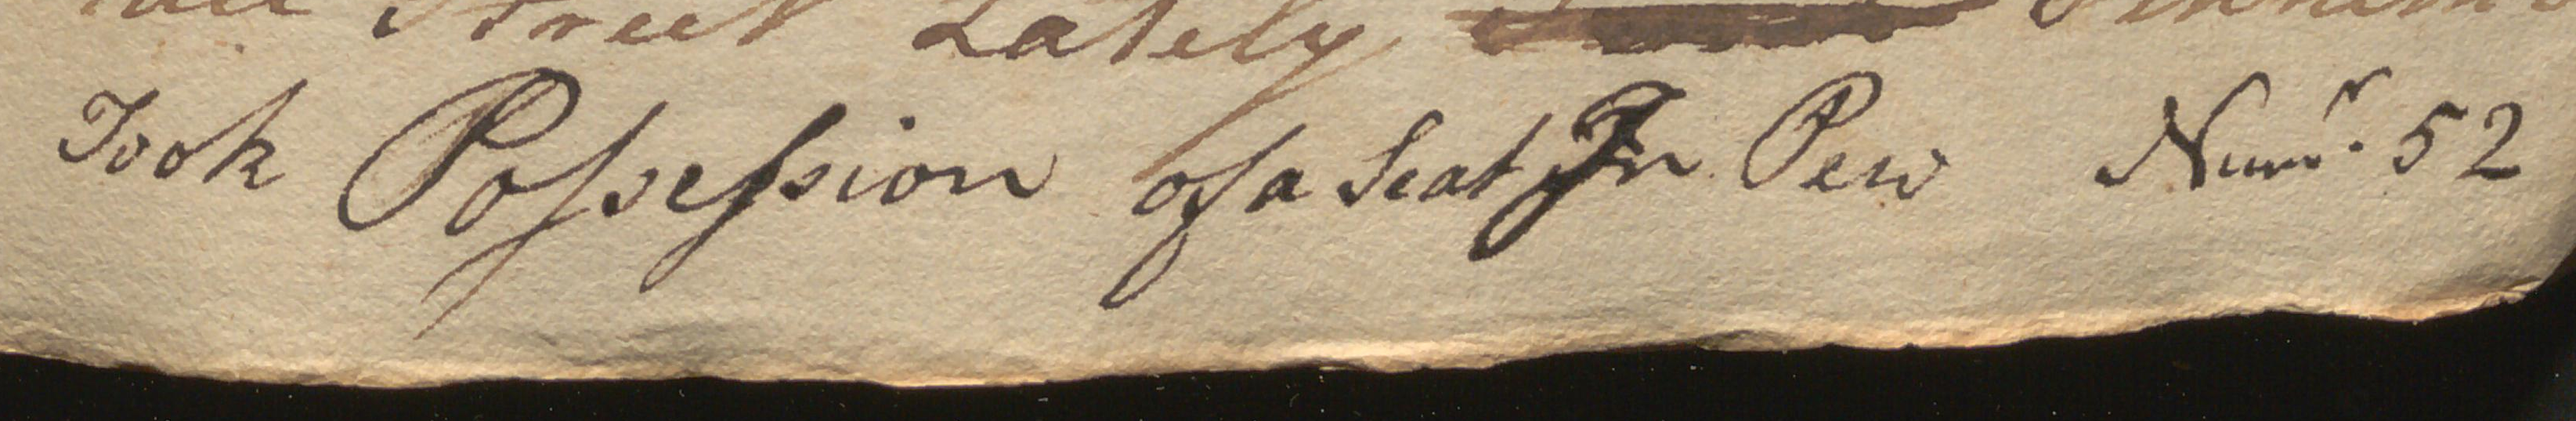Took Possession of a Seat In Pew Num^r. 52
